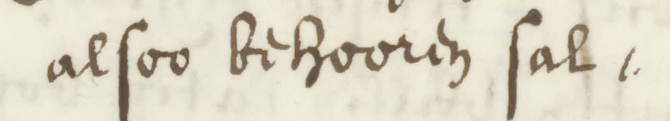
alsoo behooren sal.
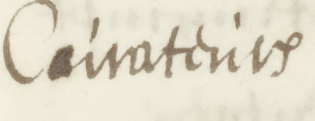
Curateurs
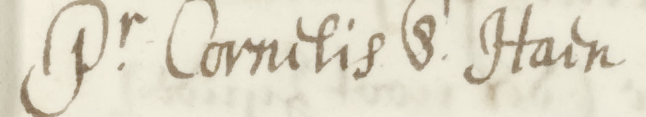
Pr. Cornelisz Haen
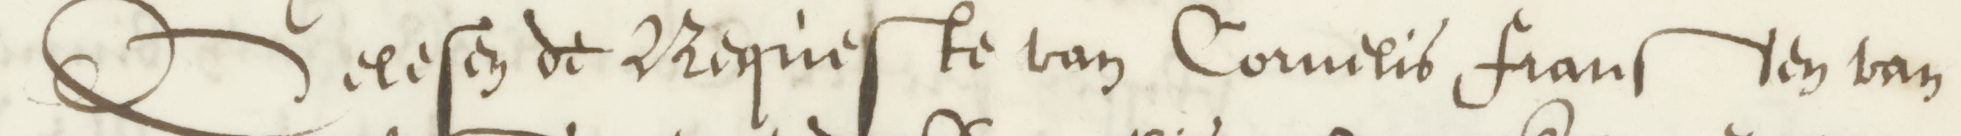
Gelesen de Requeste van Cornelis Franssen van
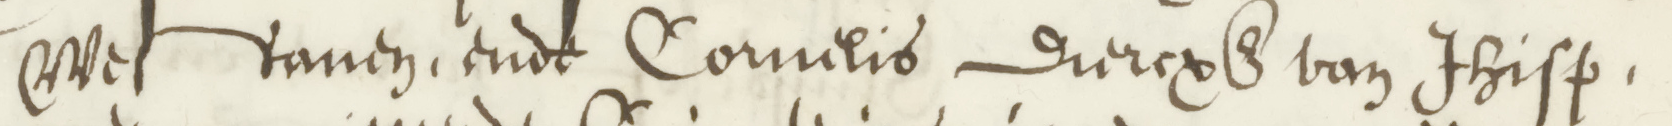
Wessanen, ende Cornelis Diercxs van Jhisp,
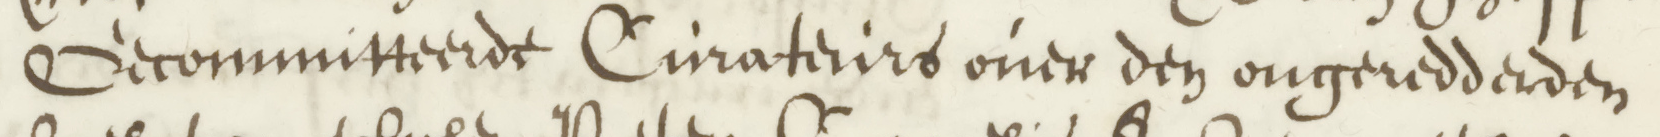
Gecommitteerde Curateurs ouer den ongeredderden
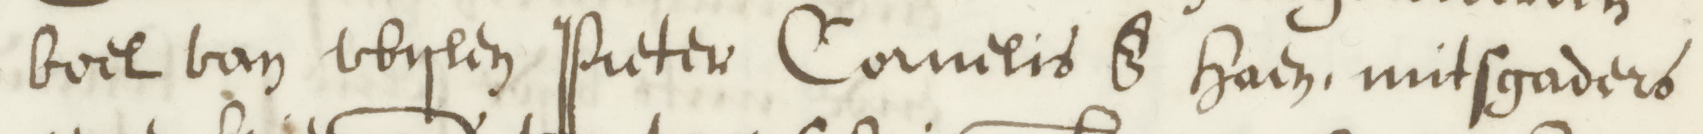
boel van wylen Pieter Cornelisz Haen, mitsgaders
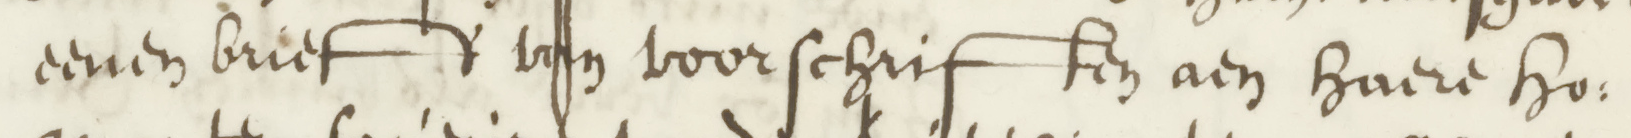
eenen brieff van voorschriften aen haere Ho:
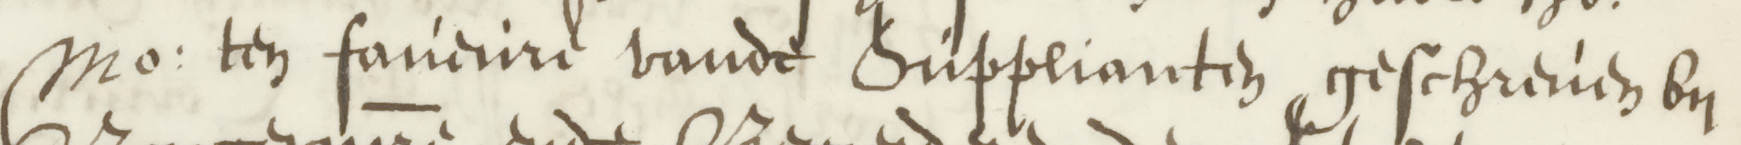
Mo: ten faveure vande Supplianten geschreuen bij
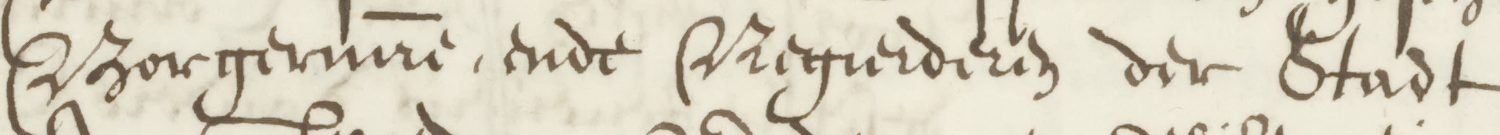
Borgermre ende Regierderen der Stadt
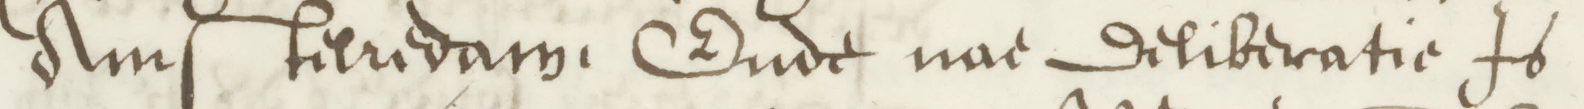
Amstelredam. Ende nae deliberatie Is
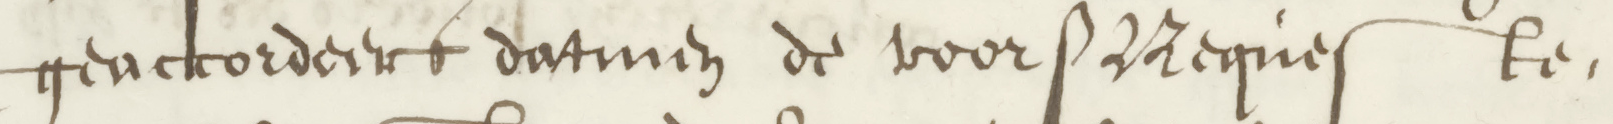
geaccordeert datmen de voors Requeste,
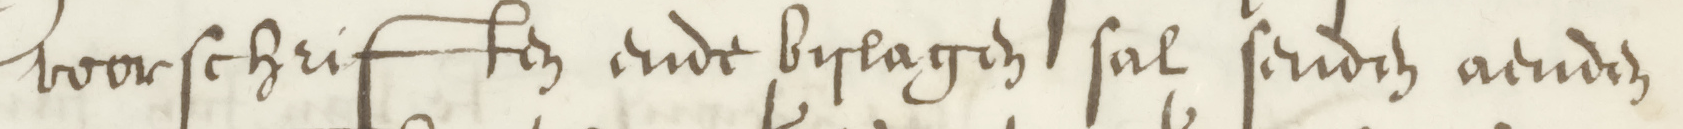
voorschriften ende bylagen sal senden aenden
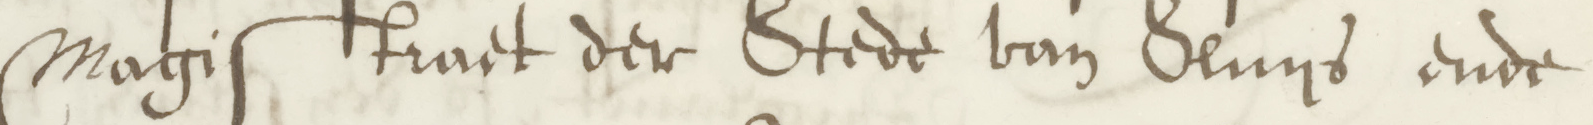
Magistraet der Stede van Sluys ende
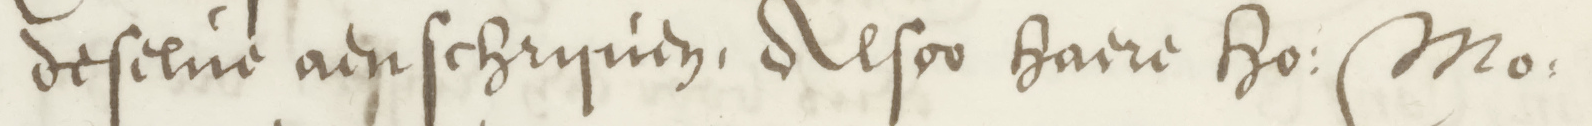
deselue aenschryuen. Alsoo haere Ho:Mo:
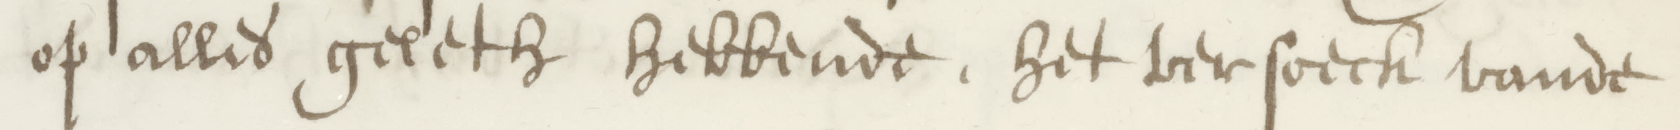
op alles geleth hebbende, het versoeck vande
